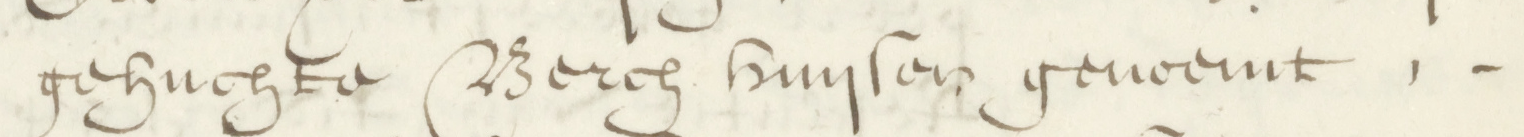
gehuchte Berchhuysen genoemt, -
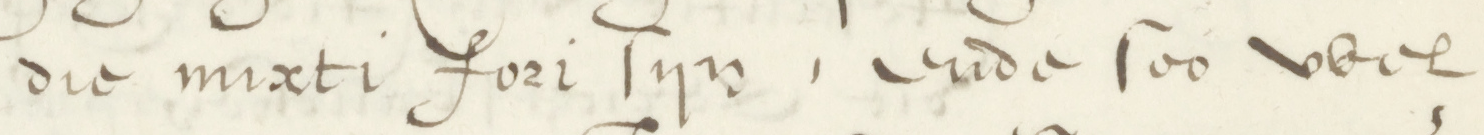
die mixti fori syn, ende soo wel
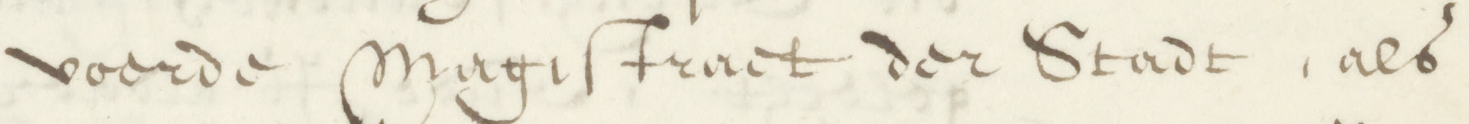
voerde Magistraet der Stadt, als
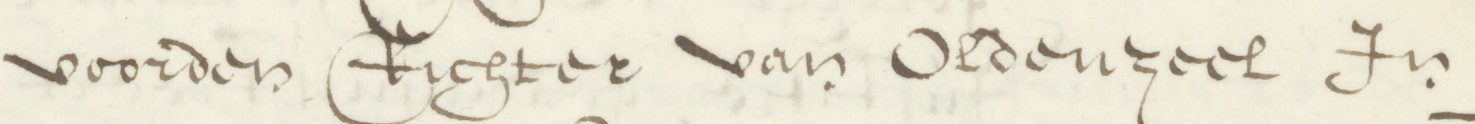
voorden Richter van Oldenzeel In
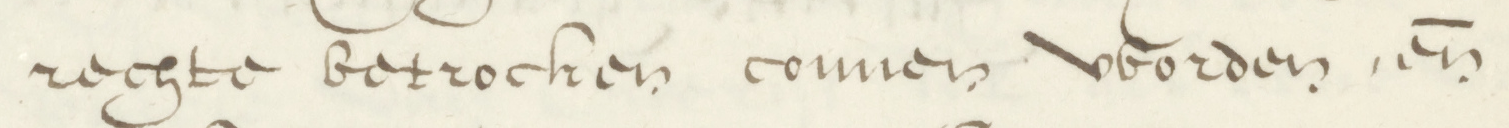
rechte betrocken connen worden, en
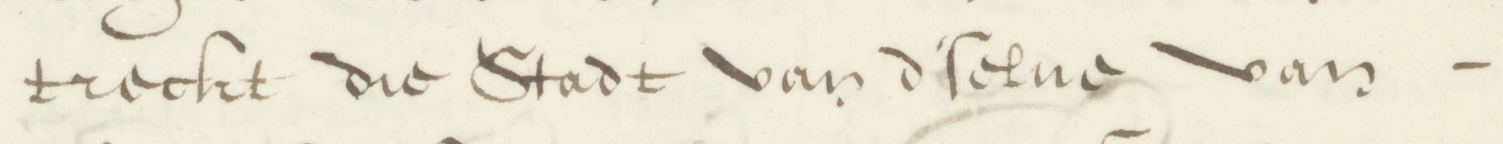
treckt die Stadt van d'selue van -
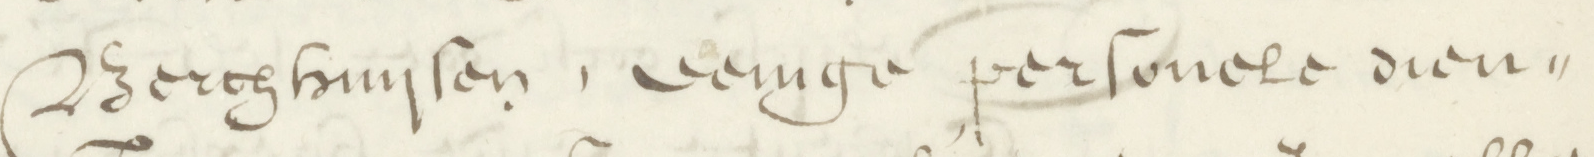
Berchhuysen, eenige personele dien„
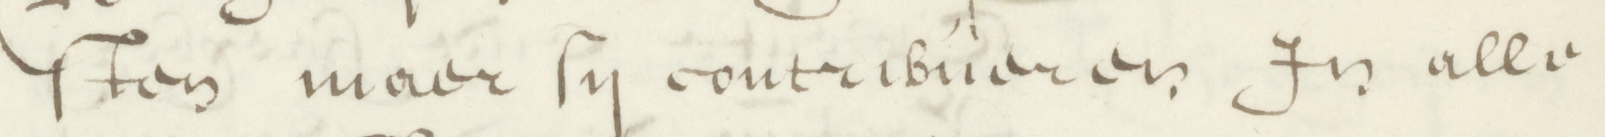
sten maer sy contribueren In alle
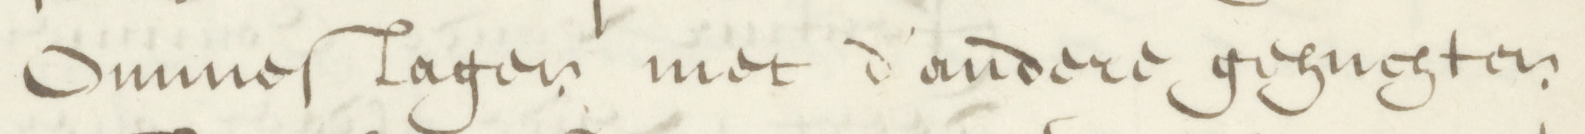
Ommeslagen met d'andere gehuchten
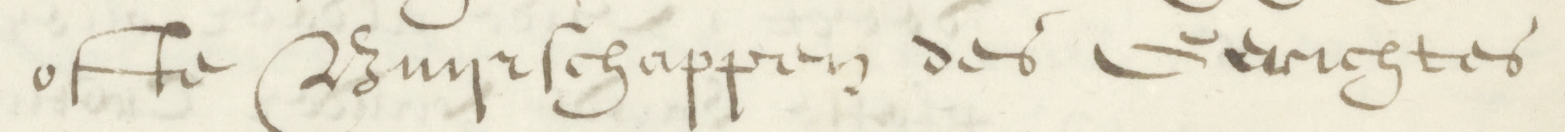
ofte Buyrschappen des Gerichtes
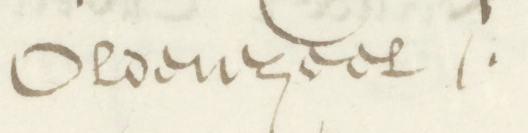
Oldenzeel.
